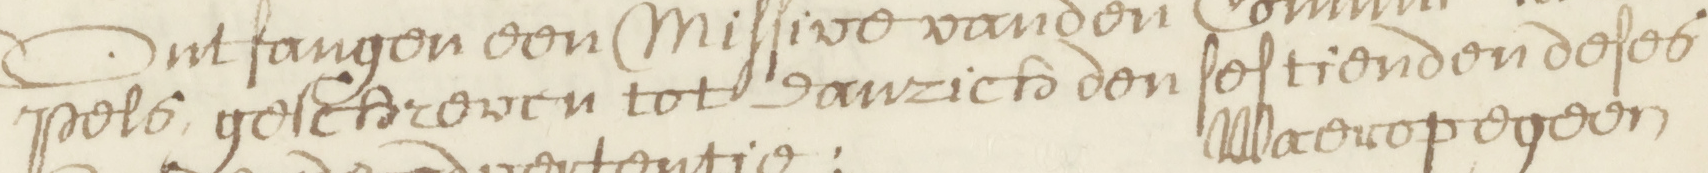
pels, geschreven tot Danzich den sestienden deses,
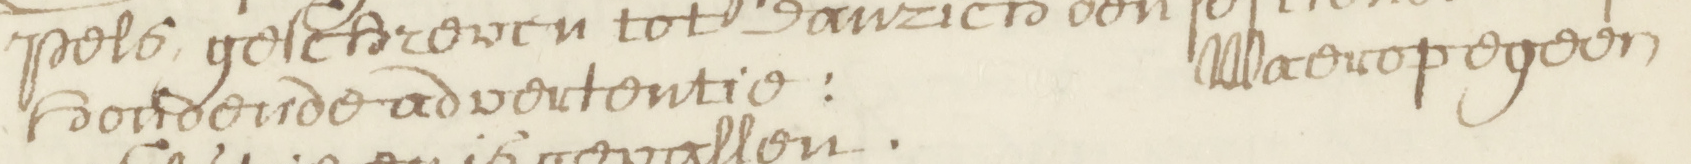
houdende advertentie: Waerop egeen
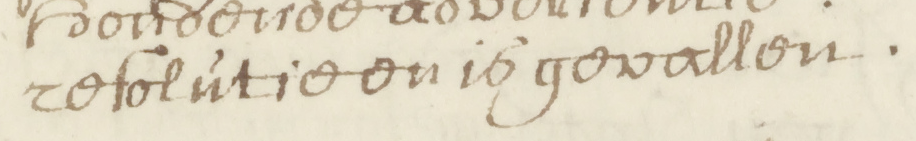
resolutie en is gevallen.
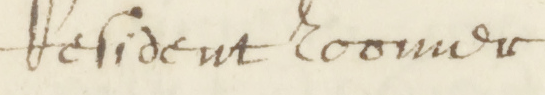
Resident roomer
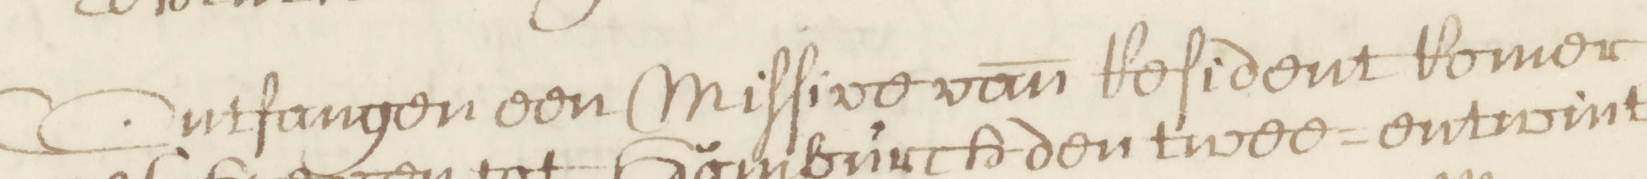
Ontfangen een Missive van Resident Romer
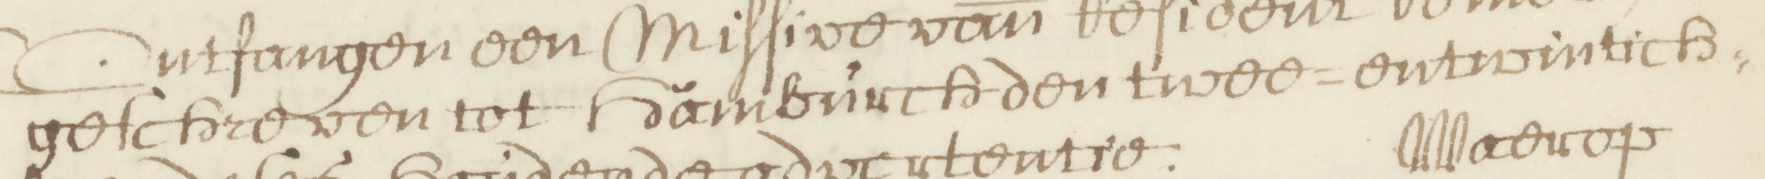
geschreven tot Hamburch den twee=entwintich„
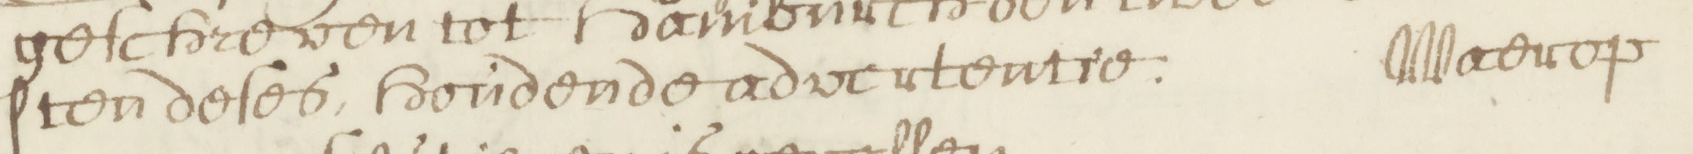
sten deses, houdende advertentie: Waerop
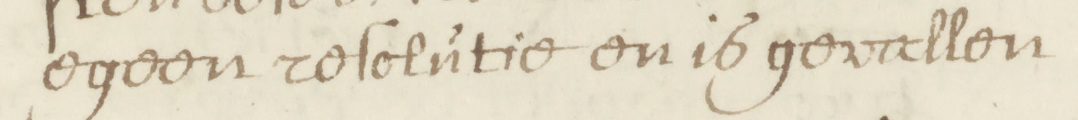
egeen resolutie en is gevallen.
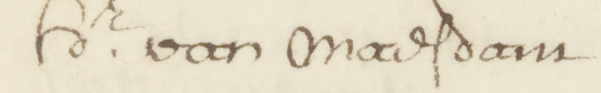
Hr. van maesdam
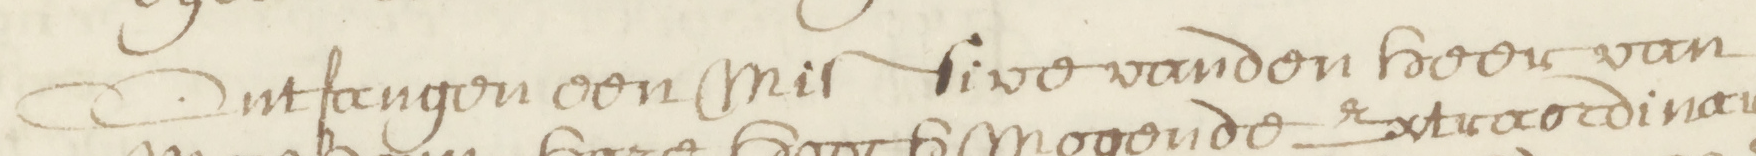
Ontfangen een Missive vanden heer van
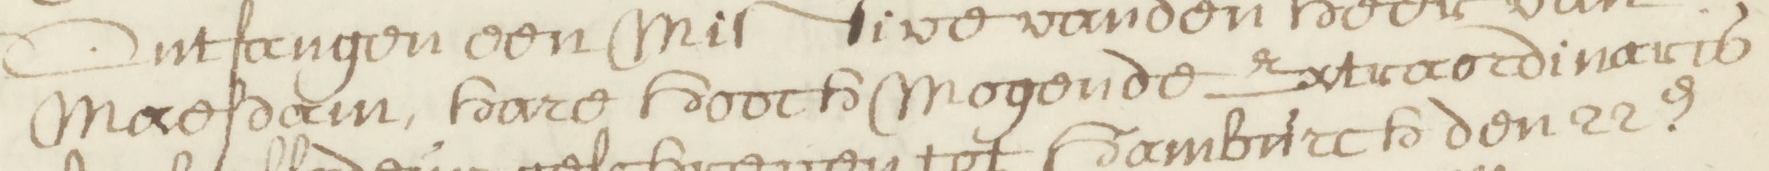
Maesdam, hare hooch mogende Extraordinaris
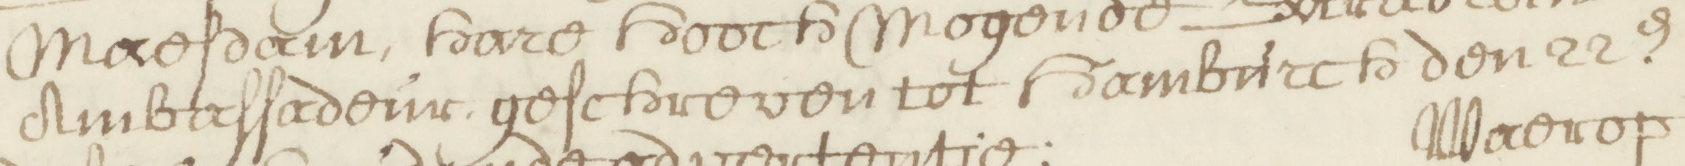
Ambassadeur, geschreven tot Hamburch den 22en
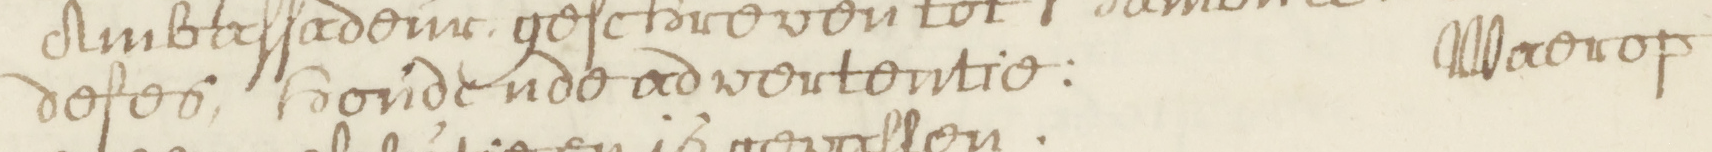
deses, houdende advertentie: Waerop
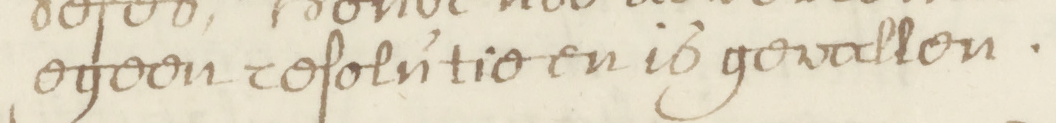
egeen resolutie en is gevallen.
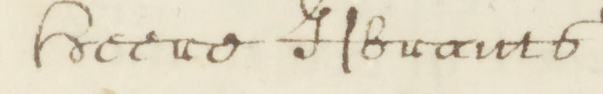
Heere Ibrants
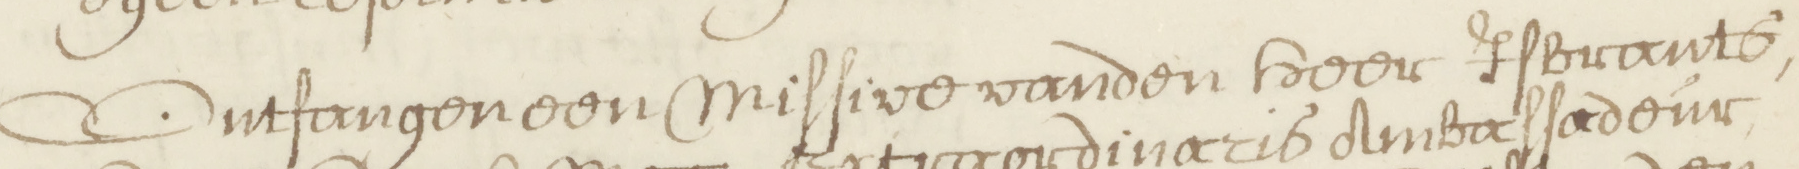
Ontfangen een Missive vanden heer Isbrants,
